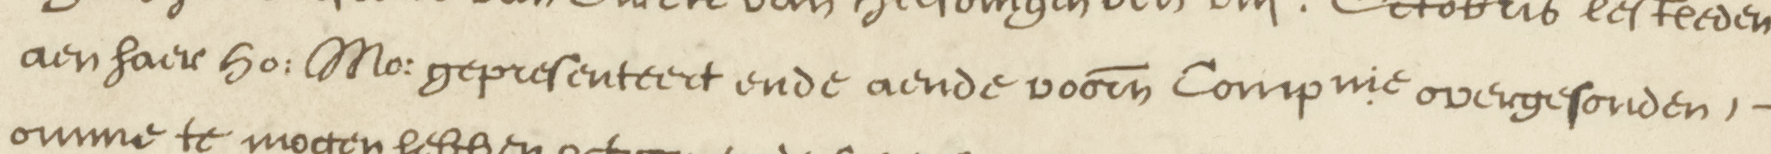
aen haer ho:Mo: gepresenteert ende aende voorn Compnie. overgesonden,
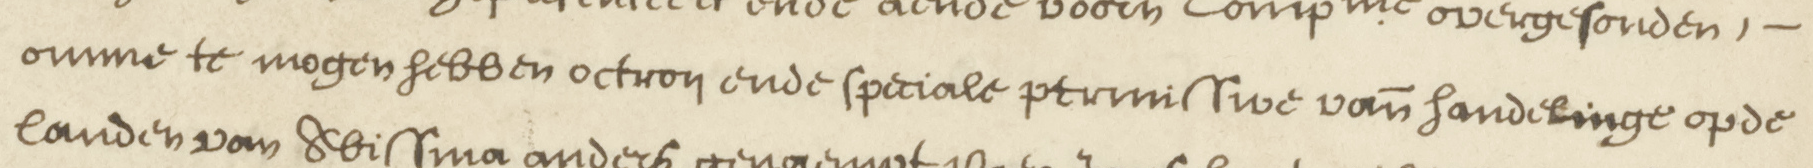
omme te mogen hebben octroy ende speciale permissive van handelinge opde
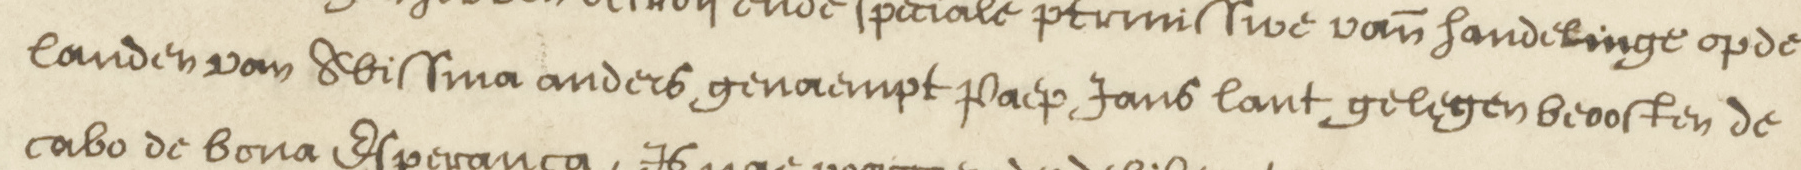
landen van Abissina anders genaempt Paep Jans lant gelegen beoosten de
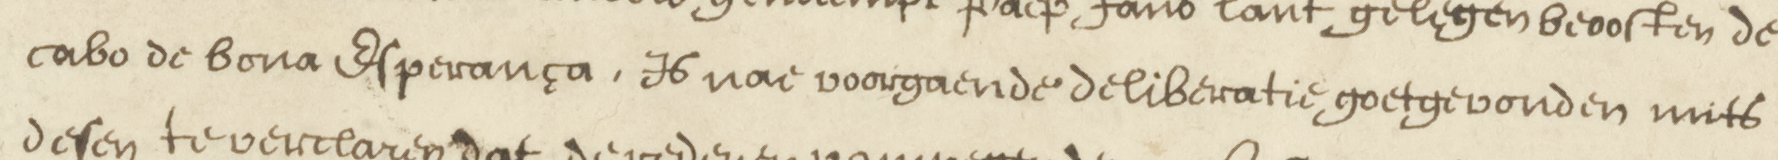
cabo de bona Esperança. Is nae voorgaende deliberatie goetgevonden mits
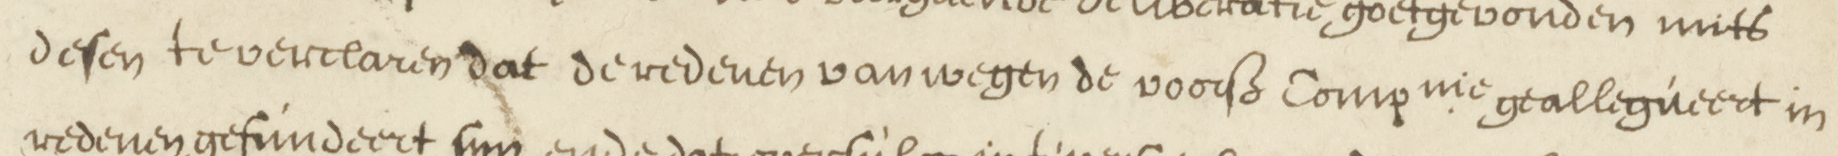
desen te verclaren dat de redenen van wegen de voors Compnie. geallegueert in
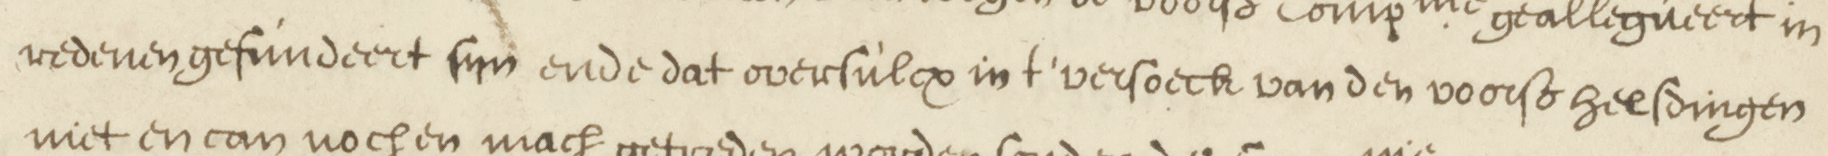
redenen gefundeert syn ende dat oversulcx in t'versoeck van den voors helsdingen
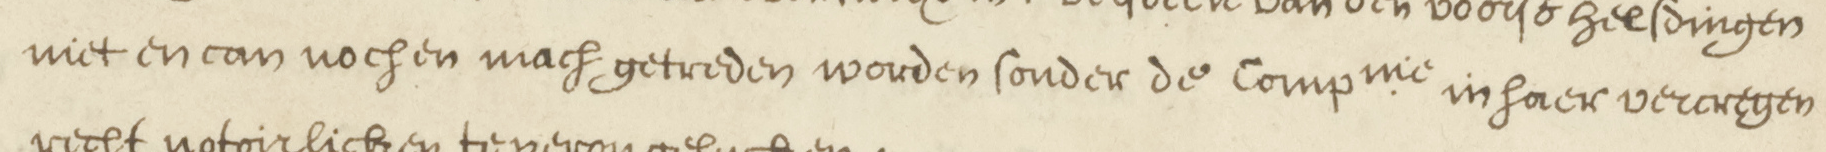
niet en can noch en mach getreden worden sonder de Compnie. in haer vercregen
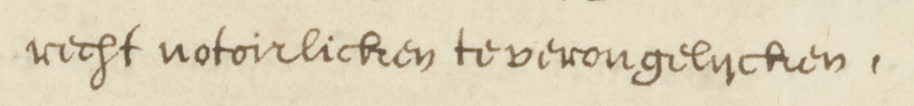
recht notoirlicken te verongelycken.
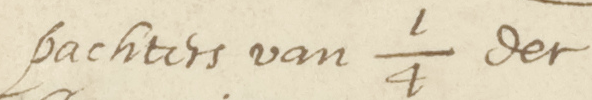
pachters van ¼ der
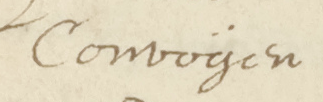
Convoijen
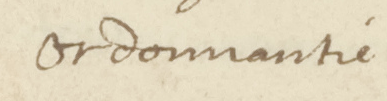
ordonnantie
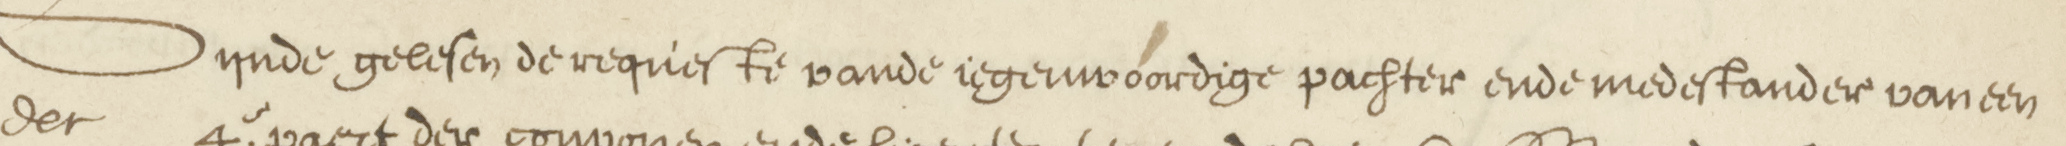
Synde gelesen de requeste vande iegenwoordige pachter ende medestander van een
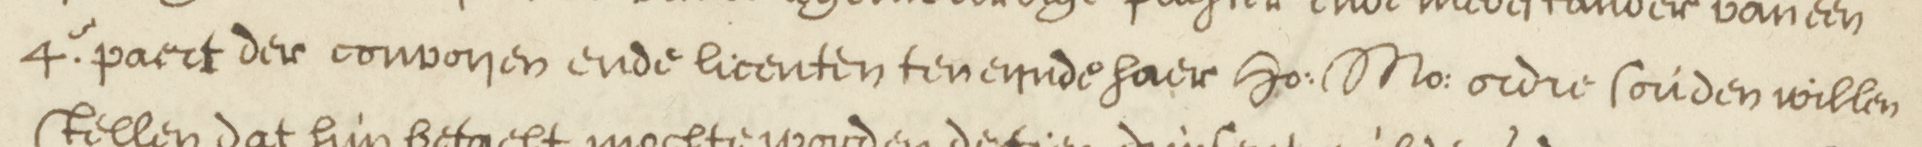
4e. paert der convoyen ende licenten ten eynde haer Ho:Mo: ordre souden willen
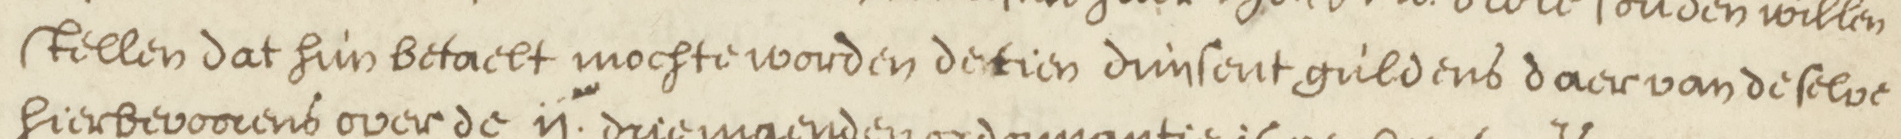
stellen dat hun betaelt mochte worden dertien duysent guldens daer van deselve
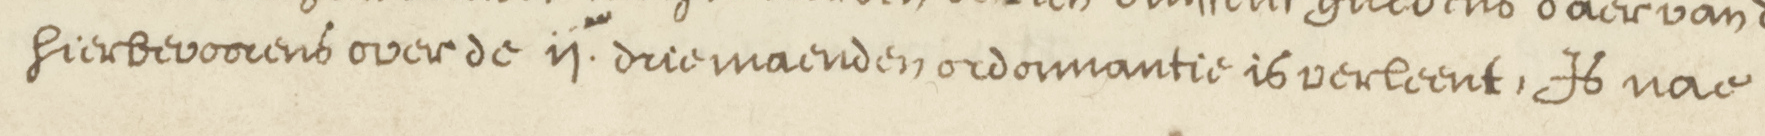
hierbevoorens over de ije. drie maenden ordonnantie is verleent. Is nae
